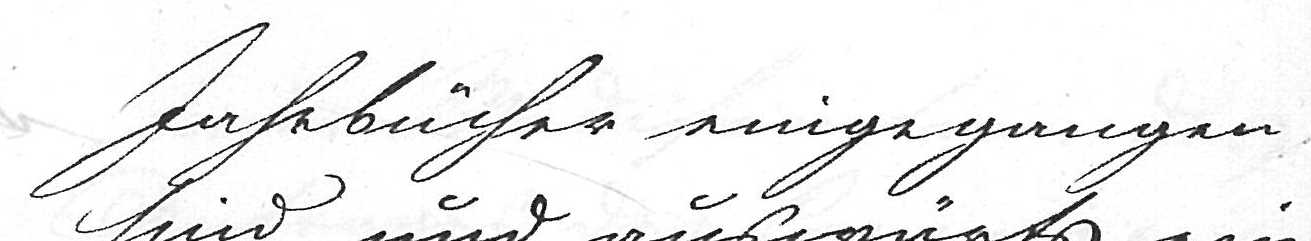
Jahrbücher eingegangen
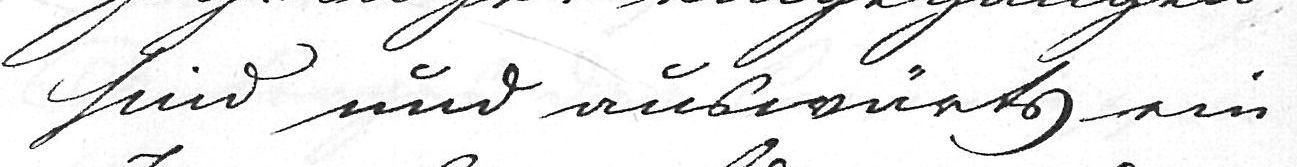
sind und auswärts ein
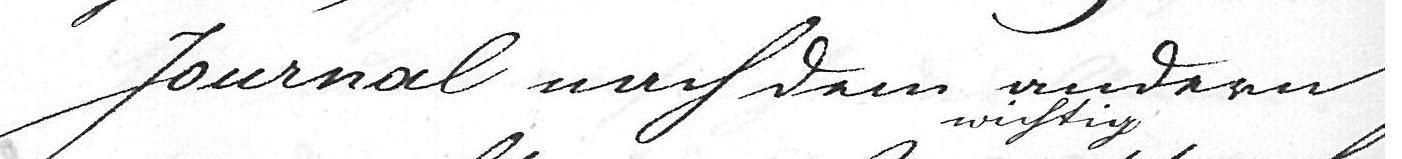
Journals nach dem andern
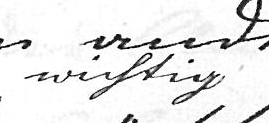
wichtig
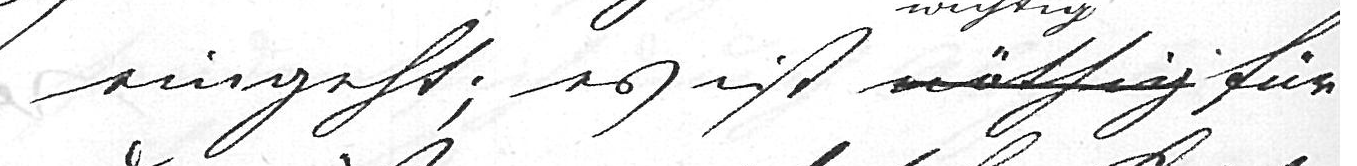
eingeht; es ist nöthig für
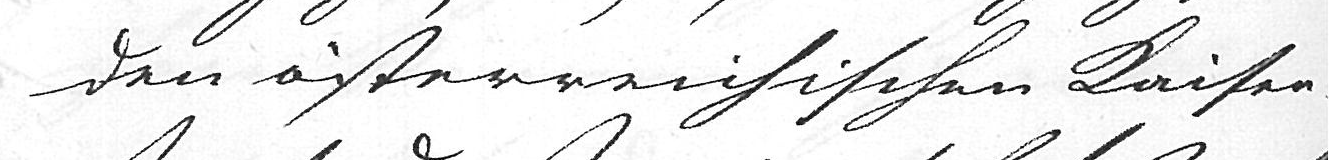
den österreichischen Kaiser-
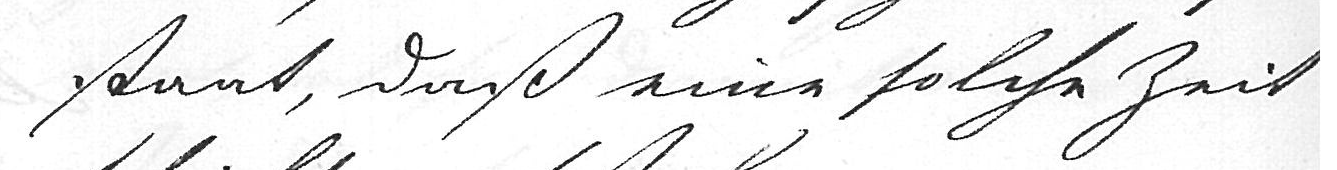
staat, daß eine solche Zeit-
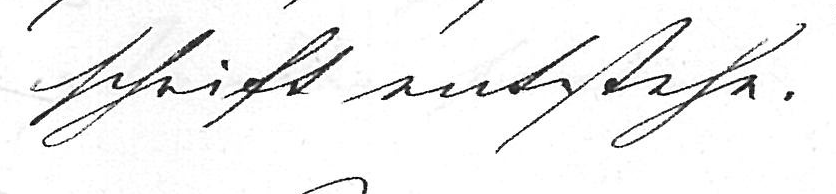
schrift entstehe.
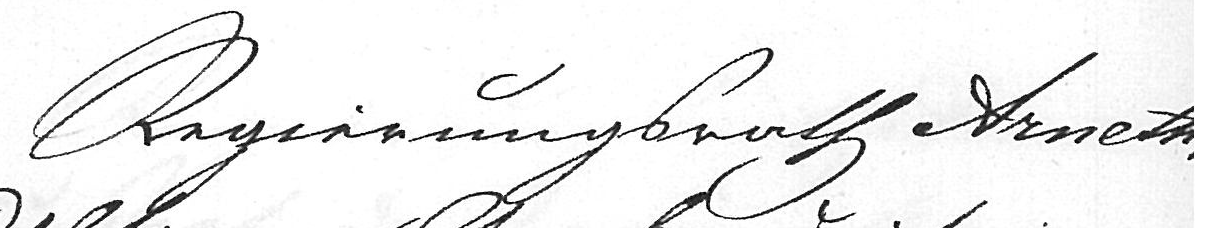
Regierungsrath Arneth:
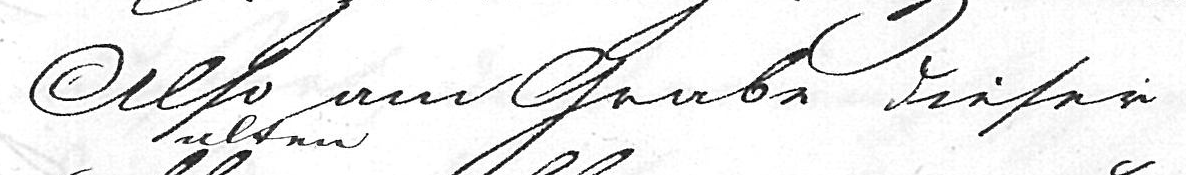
Also am Grabe dieser
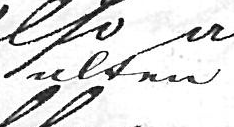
alten
